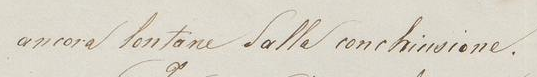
ancora lontane dalla conchiusione.
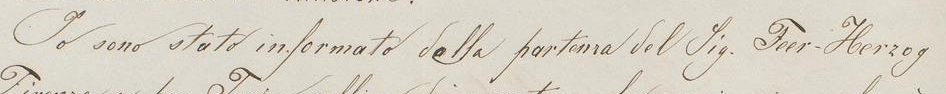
Io sono stato informato dalla partenza del Sig. Feer-Herzog
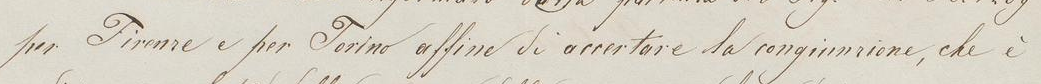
per Firenze e per Torino affine di accertare la congiunzione, che
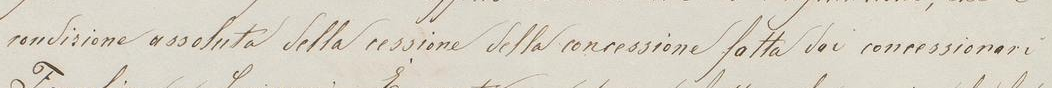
condizione assoluta della cessione della concessione fatta dai concessionari
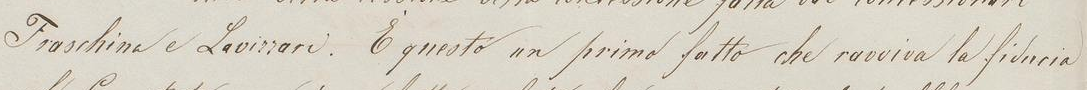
Fraschina e Lavizzari. È questo un primo fatto che ravviva la fiducia
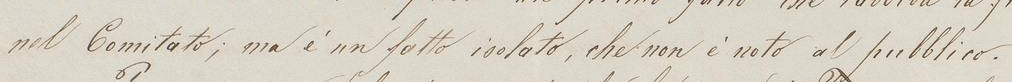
nel Comitato; ma è un fatto isolato, che non è noto al pubblico.
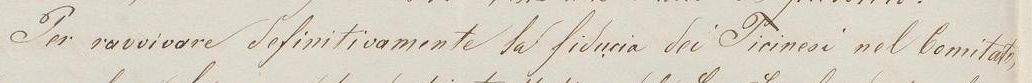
Per ravvivare definitivamente la fiducia dei Ticinesi nel Comitato,
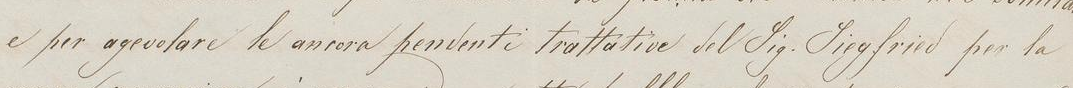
e per agevolare le ancora pendenti trattative del Sig. Siegfried per la
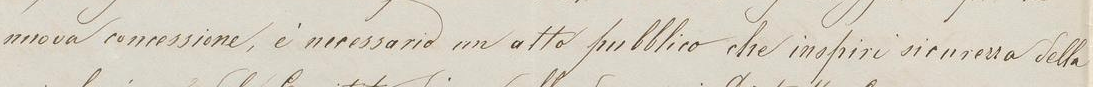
nuova concessione, è necessario un atto pubblico che inspire sicurezza della
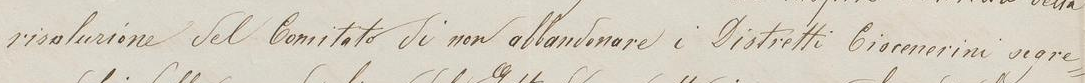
risoluzione del Comitato di non abbandonare i Distretti Ciscenerini segre-
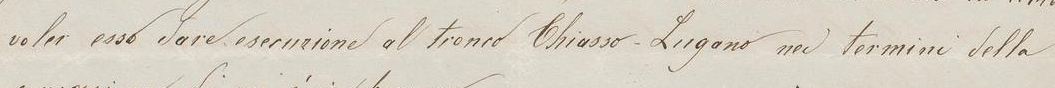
voler esso dare esecuzione al tronco Chiasso–Lugano nei termini della
